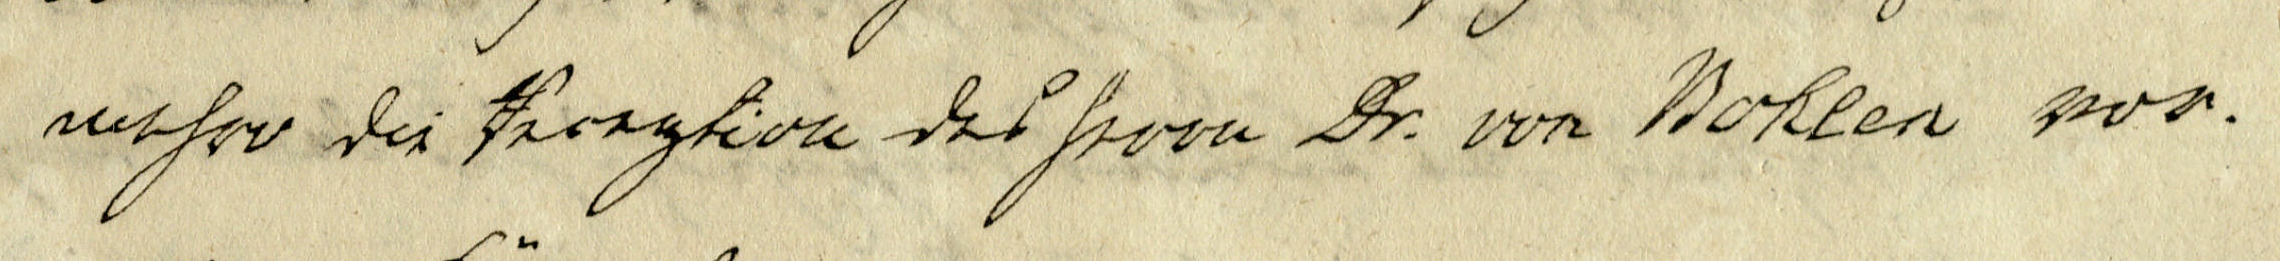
mehro die Reception des Herrn Dr. von Bohlen vor¬
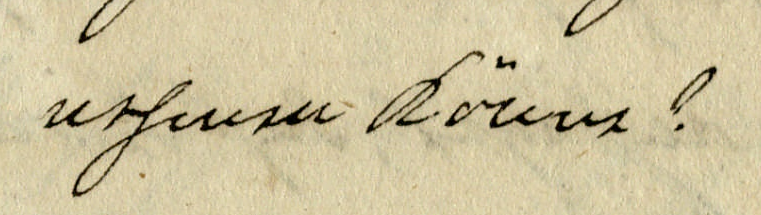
nehmen könne?
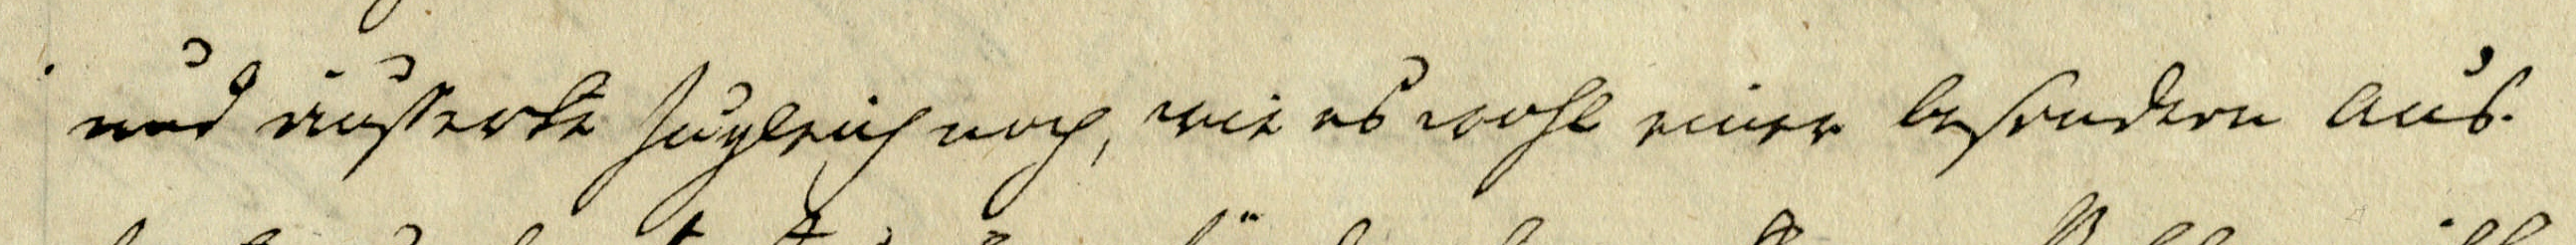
und äusserte zugleich noch, wie es wohl einer besondern Aus¬
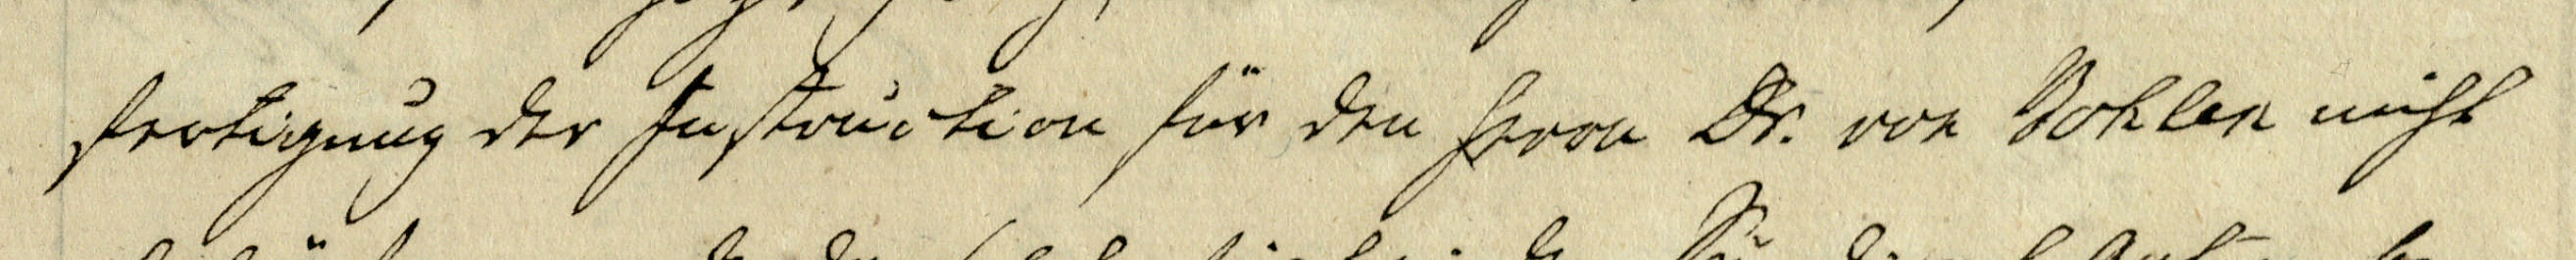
fertigung der Instruction für den Herrn Dr. von Bohlen nicht
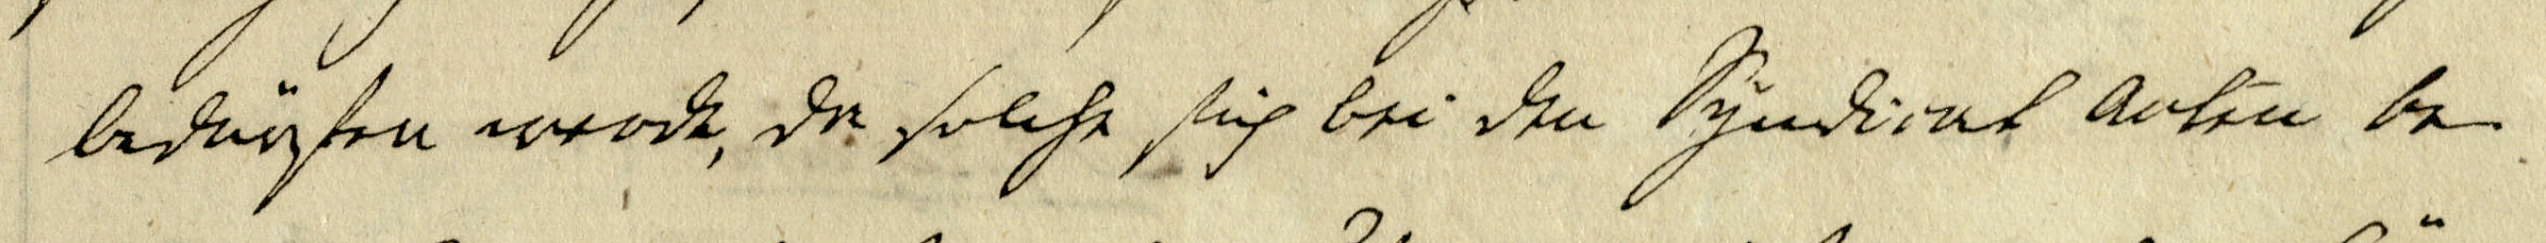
bedürfen werde, da solche sich bei den Sÿndicat Acten be¬
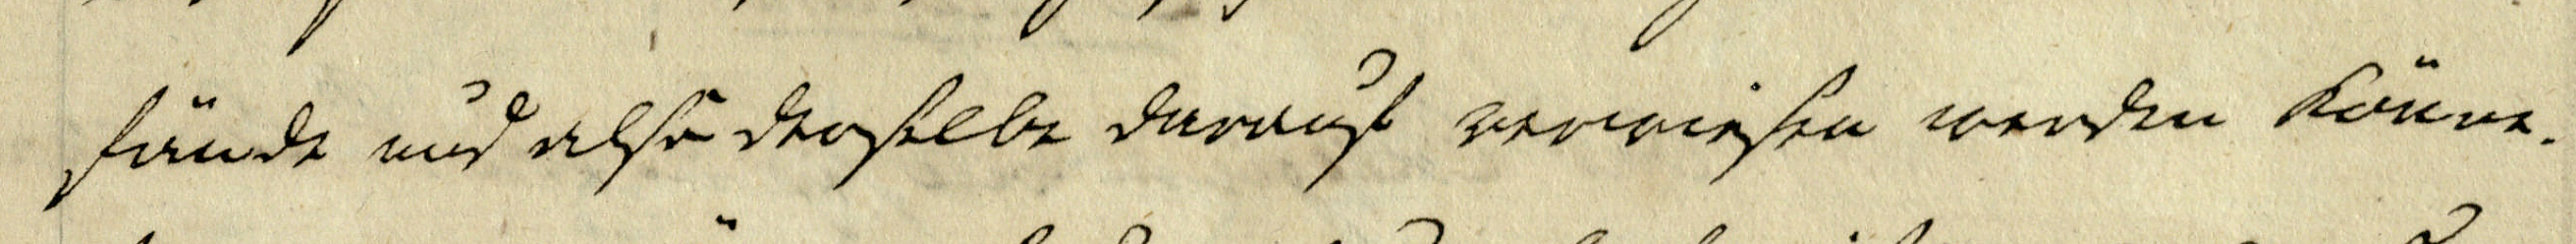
fände und also derselbe darauf verwiesen werden könne.
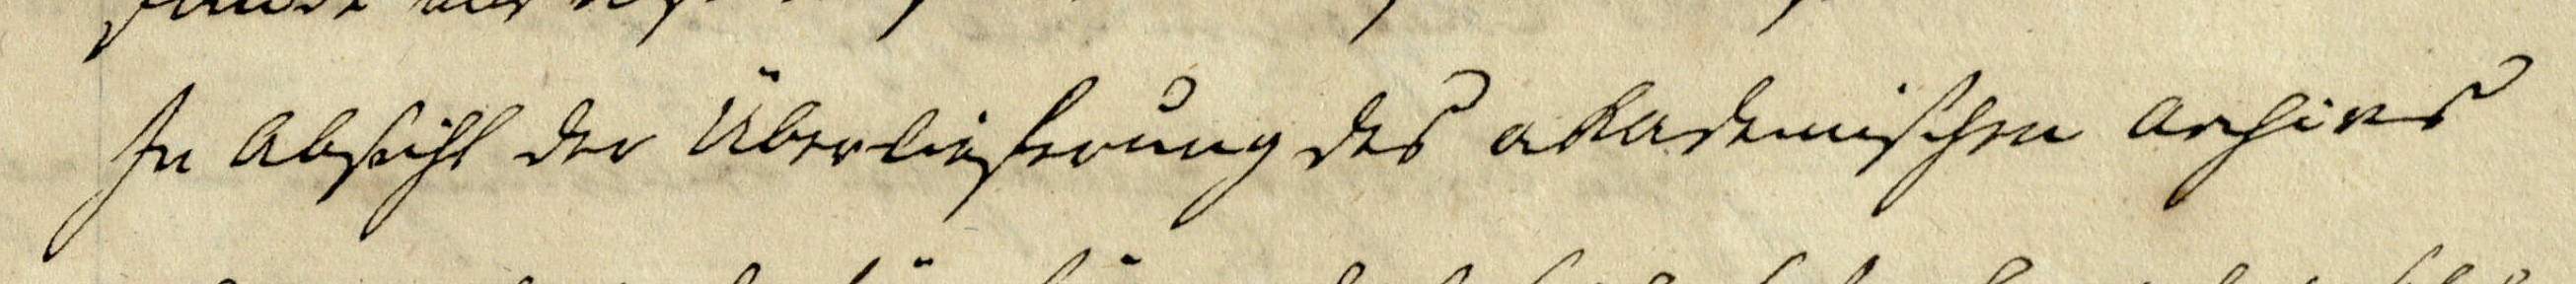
In Absicht der Überlieferung des akademischen Archivs
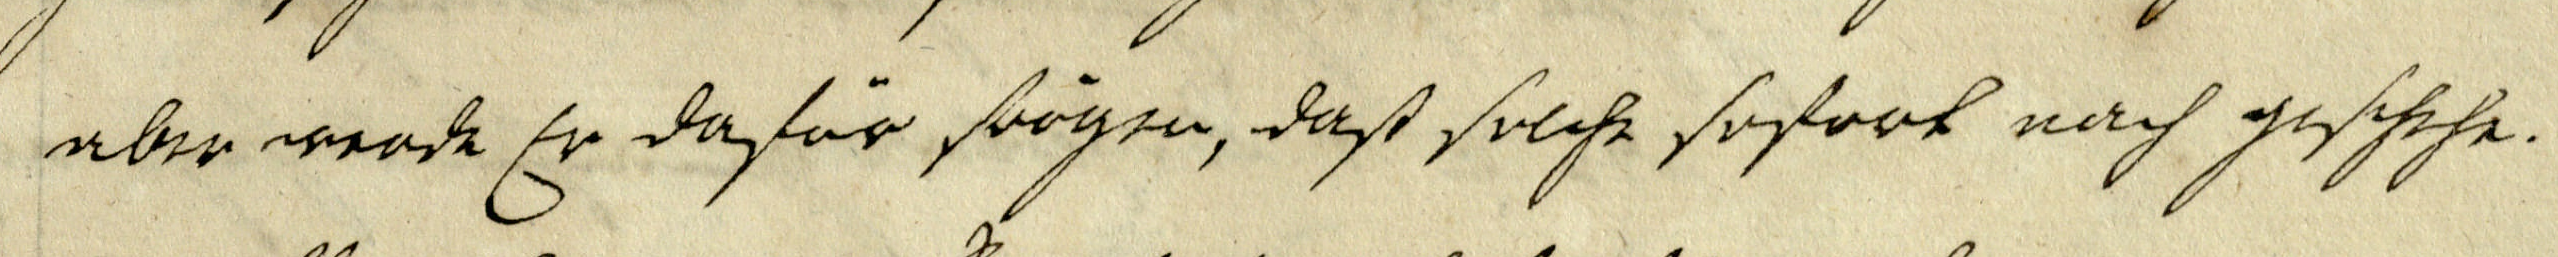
aber werde Er dafür sorgen, daß solche sofort nach geschehe¬
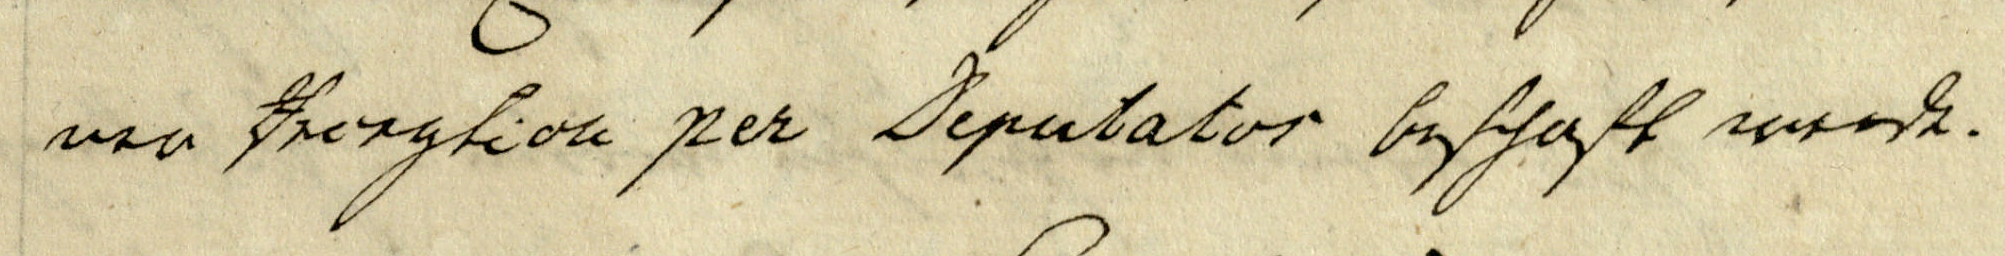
ner Reception per Deputatos beschaft werde.
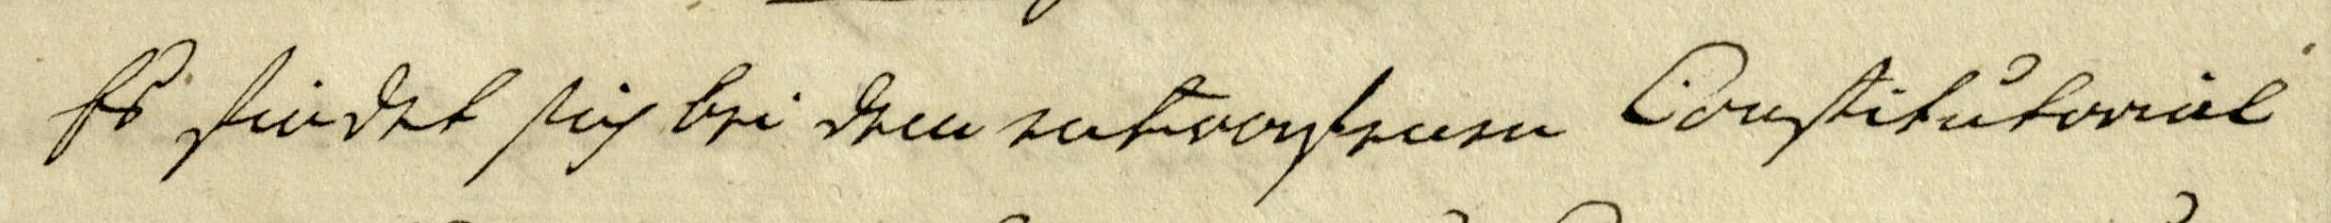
Es findet sich bei dem entworfenen Constitutorial
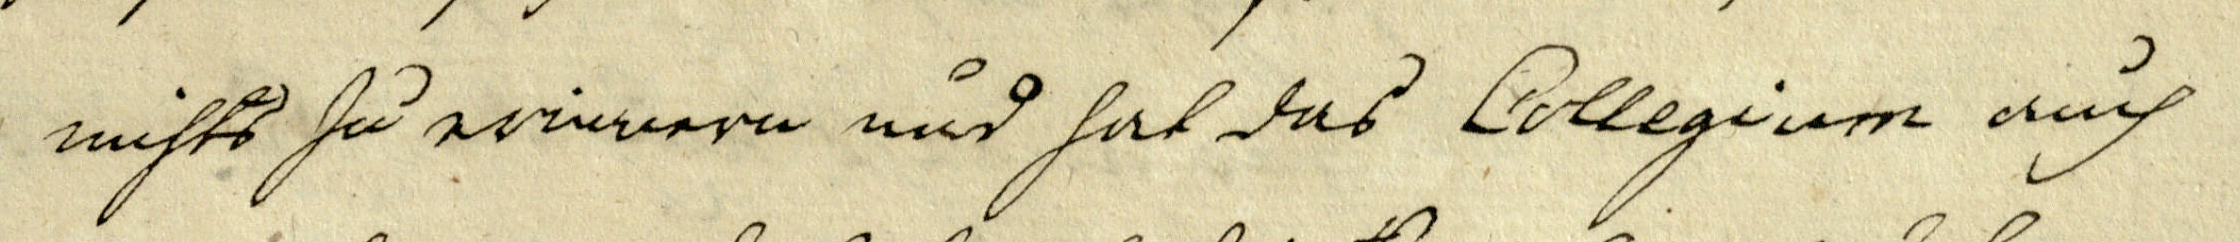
nichts zu erinnern und hat das Collegium auch
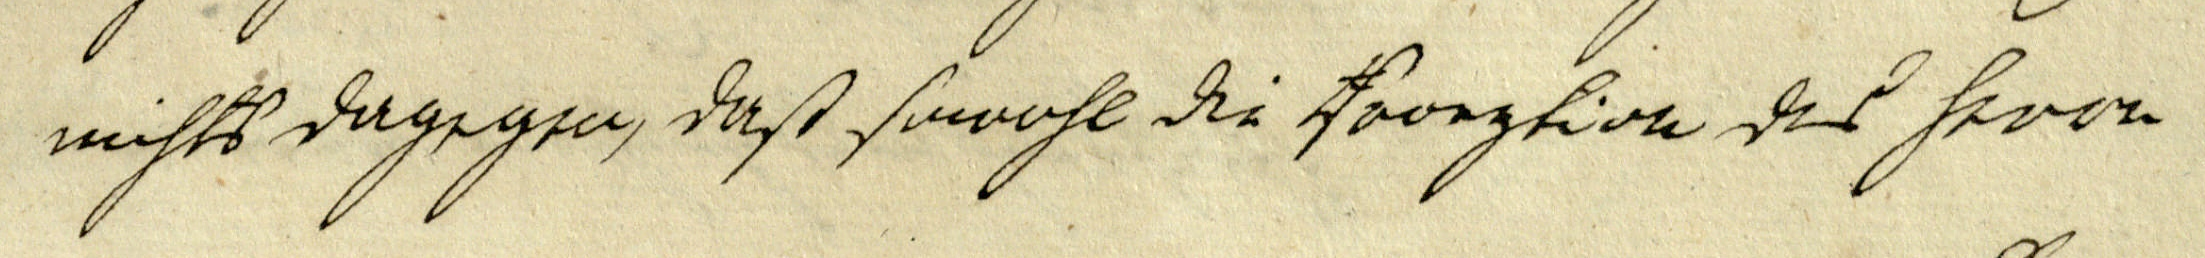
nichts dagegen, daß sowohl die Reception des Herrn
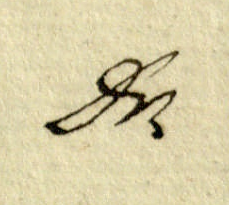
Dr.
